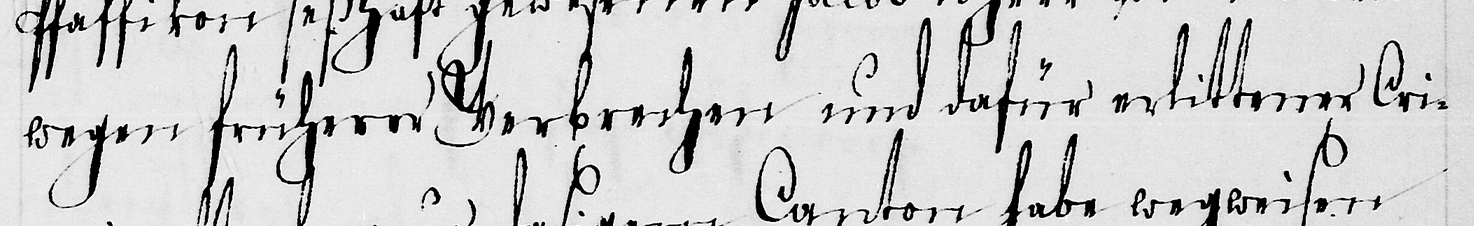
wegen früherer Verbrechen und dafür erlittener Cr¬
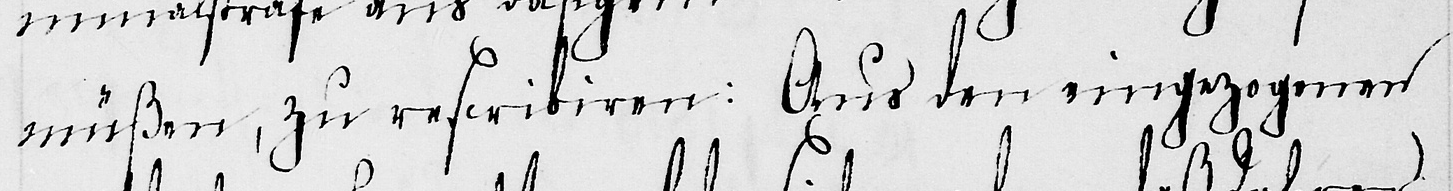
müssen, zu rescribiren: Aus den eingezogenen
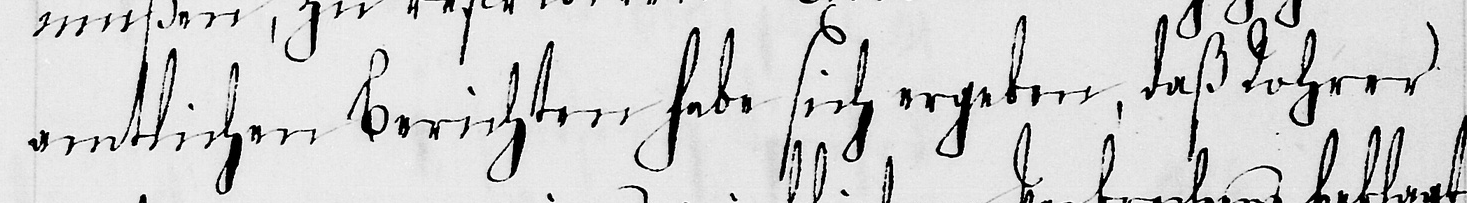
amtlichen Berichten habe sich ergeben, daß Rohrer
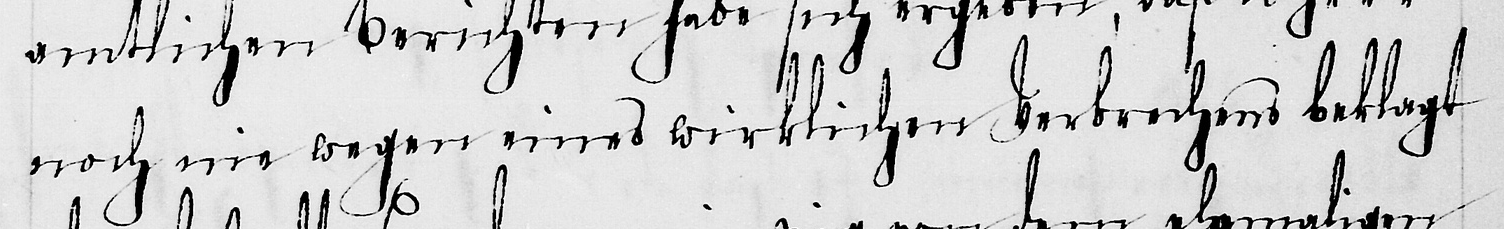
noch nie wegen eines wirklichen Verbrechens beklagt
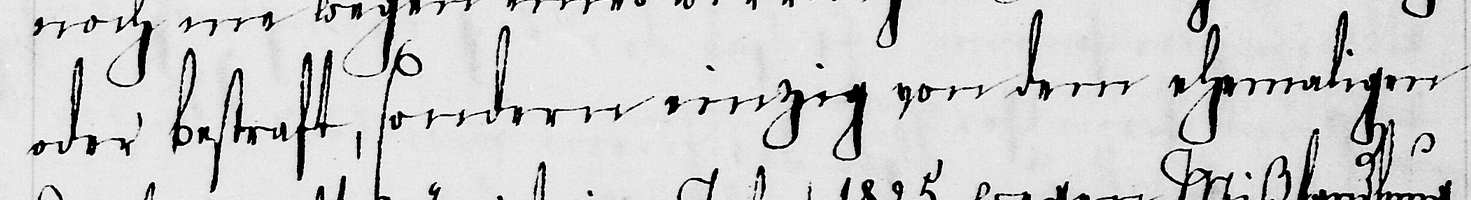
oder bestraft, sondern einzig von dem ehemaligen
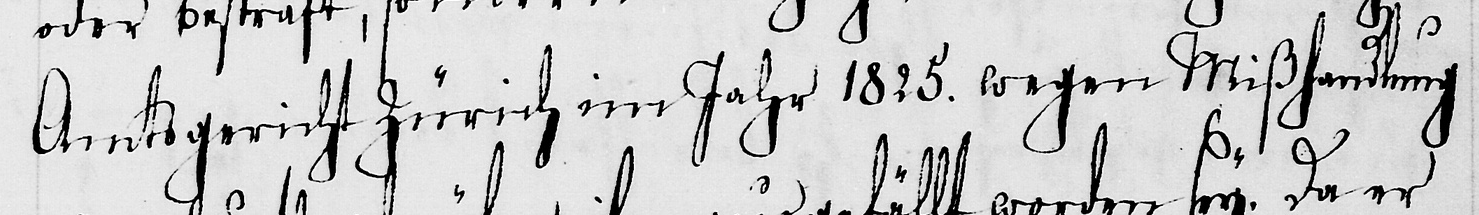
Amtsgericht Zürich im Jahr 1825. wegen Misshandlung
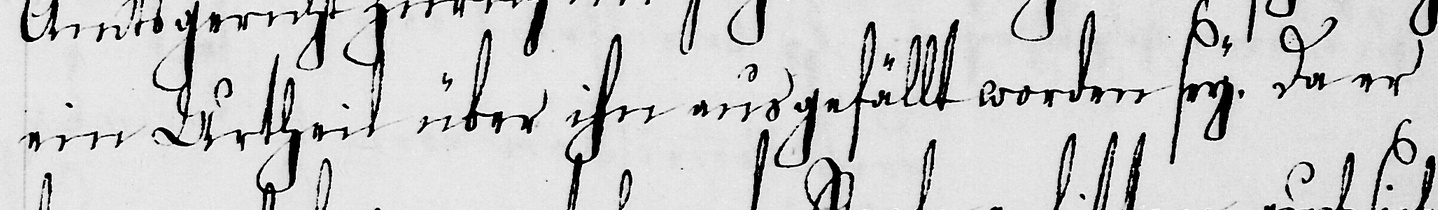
ein Urtheil über ihn ausgefällt worden sey. Da er
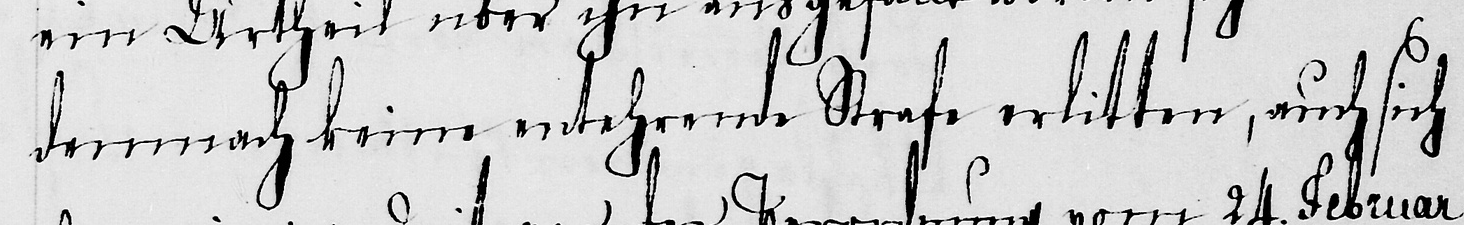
demnach keine entehrende Strafe erlitten, auch sich
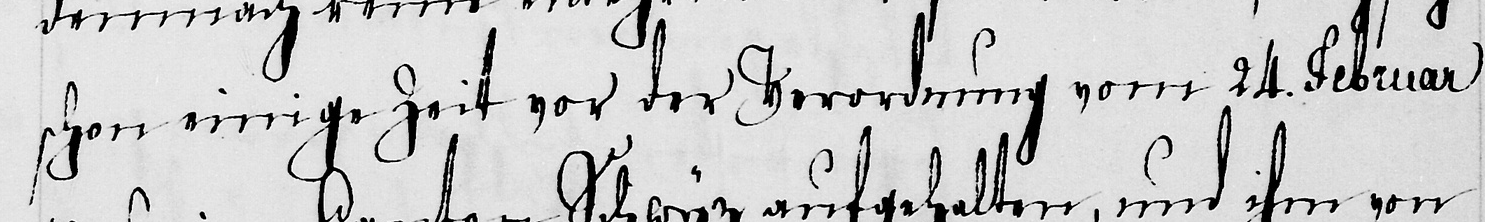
schon einige Zeit vor der Verordnung vom 24. Februar
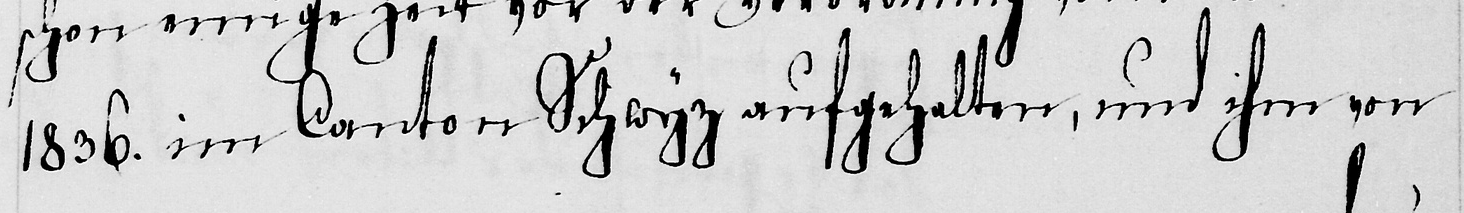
1836. im Canton Schwyz aufgehalten, und ihm von
